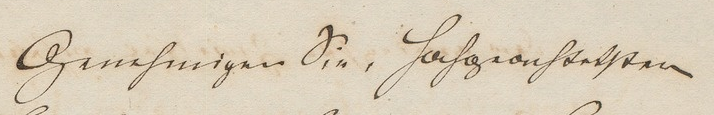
Genehmigen Sie, hochgeachtetster
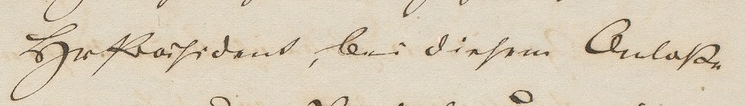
Hr Präsident, bei diesem Anlaße
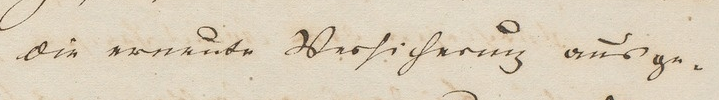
die erneute Versicherung ausge-
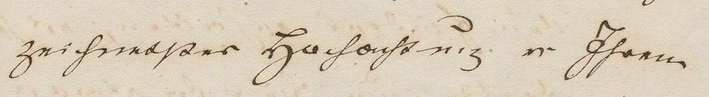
zeichnetster Hochachtung v. Ihrem
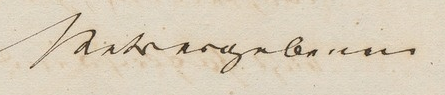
stets ergebenen
